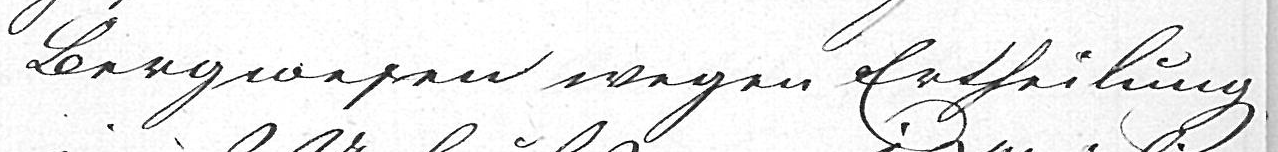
Bergwesen wegen Ertheilung
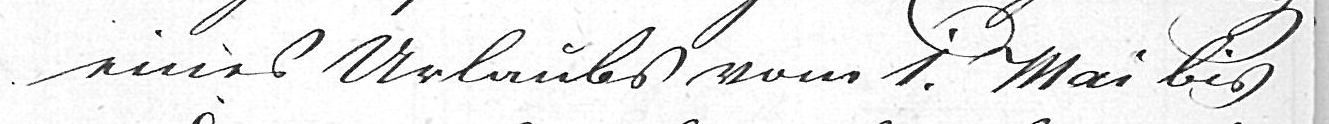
eines Urlaub vom 1. Mai bis
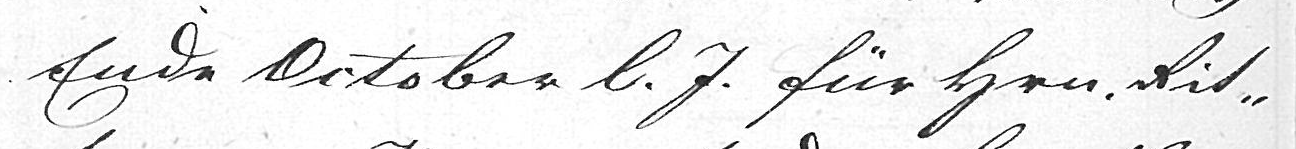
Ende October l.J. für Hrn. Rit-
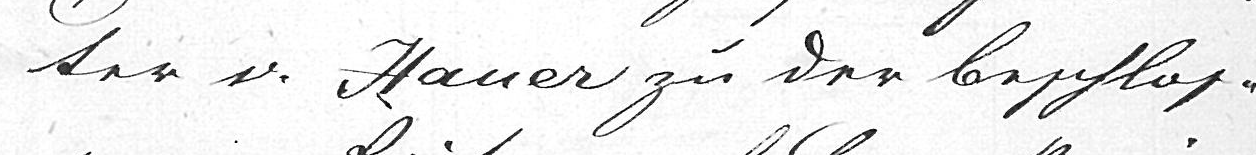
ter v. Hauer zu der beschlos-
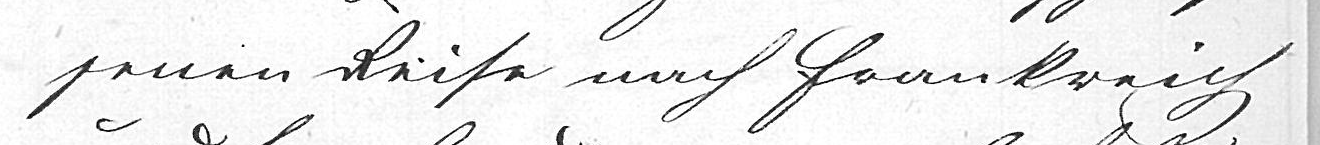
senen Reise nach Frankreich
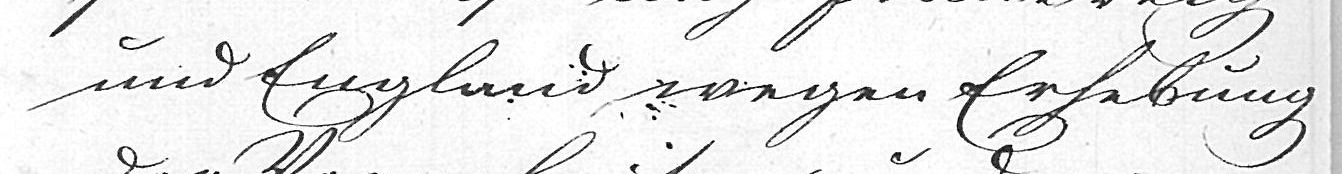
und England wegen Erhebung
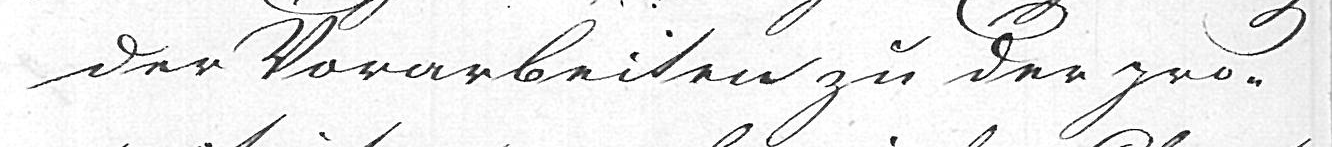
der Vorarbeiten zu der pro-
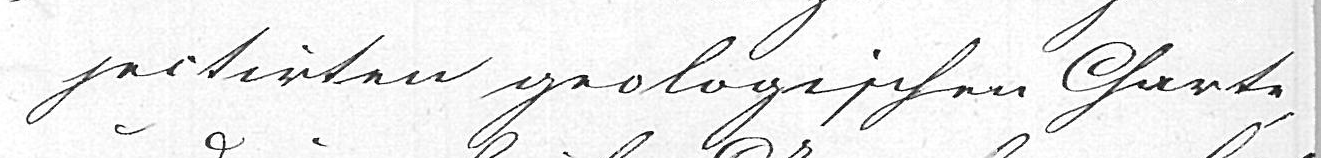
jectirten geologischen Charte
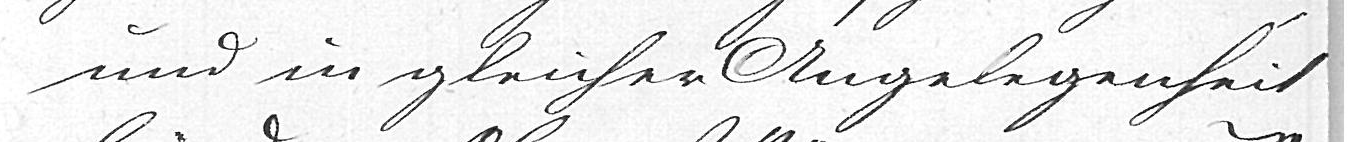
und in gleichen Angelegenheit
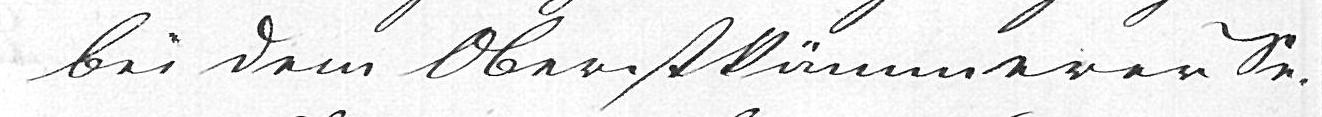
bei dem Oberstkämmerer Sr.
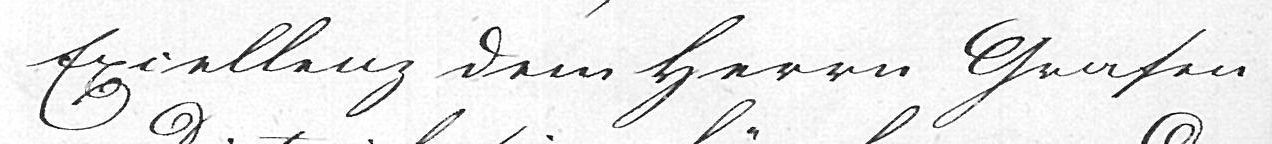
Excellenz dem Herrn Grafen
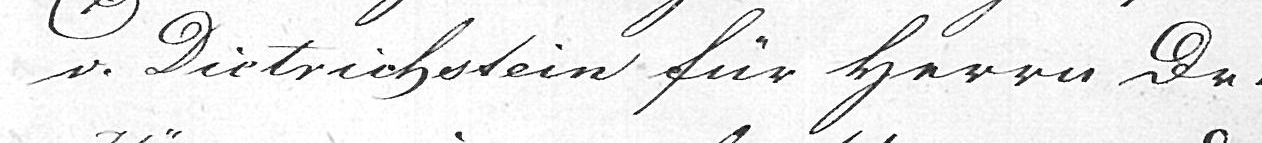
v. Dietrichstein für Herrn Dr.
